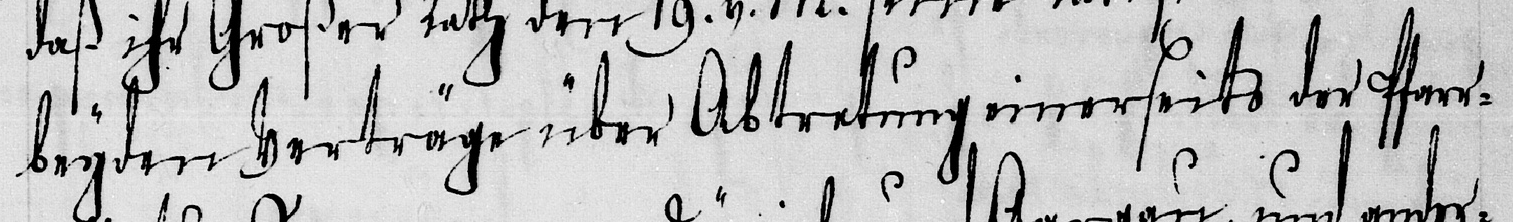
beyden Verträge über Abtretung einerseits der Pfar¬
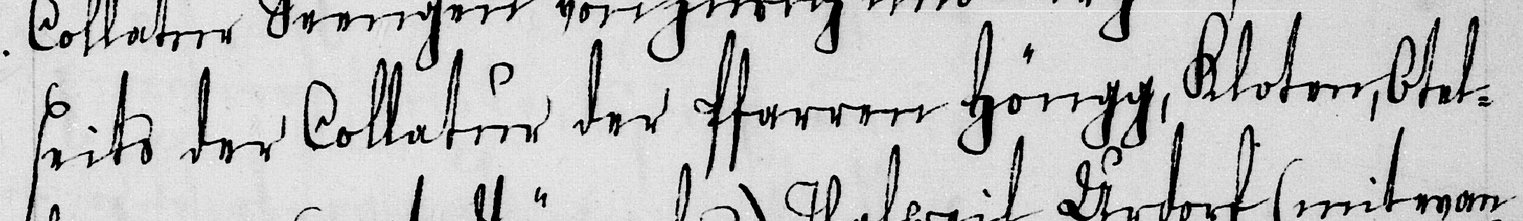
seits der Collatur der Pfarren Höngg, Kloten, Otel¬
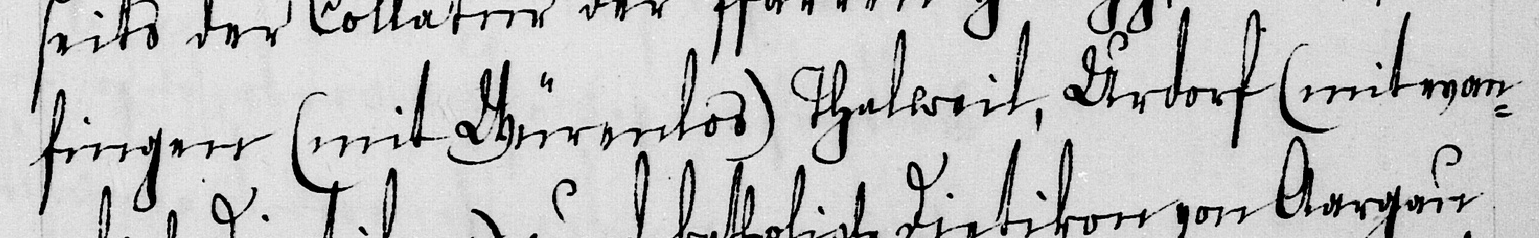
fingen (mit Würenlos) Thalweil, Urdorf (mit evan¬
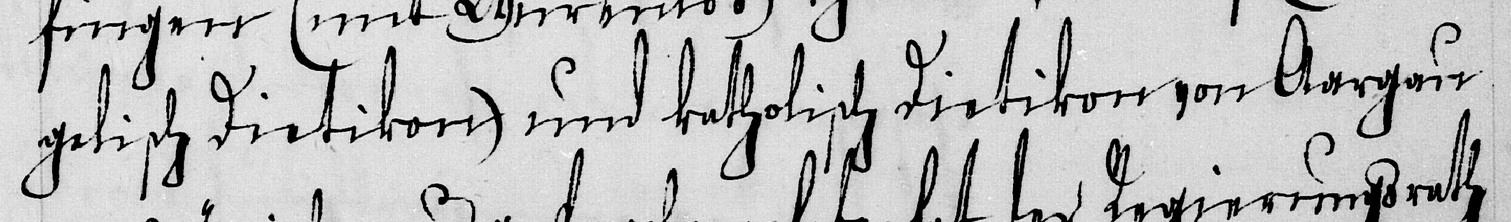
gelisch Dietikon) und katholisch Dietikon von Aargau
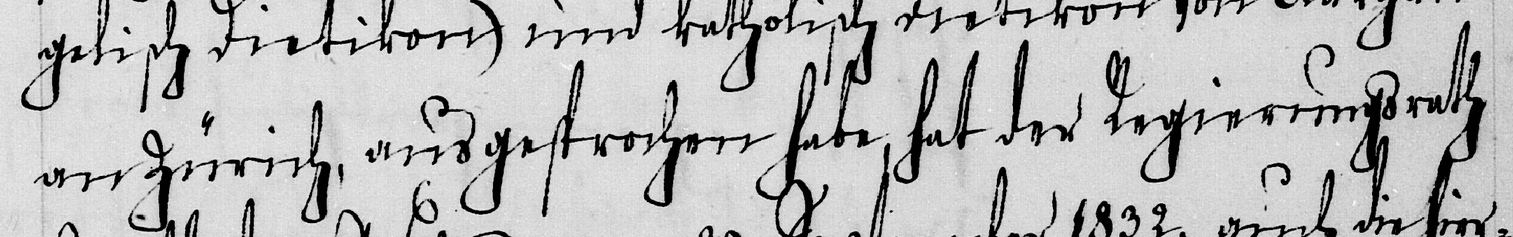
an Zürich, ausgesprochen habe, hat der Regierungsrath
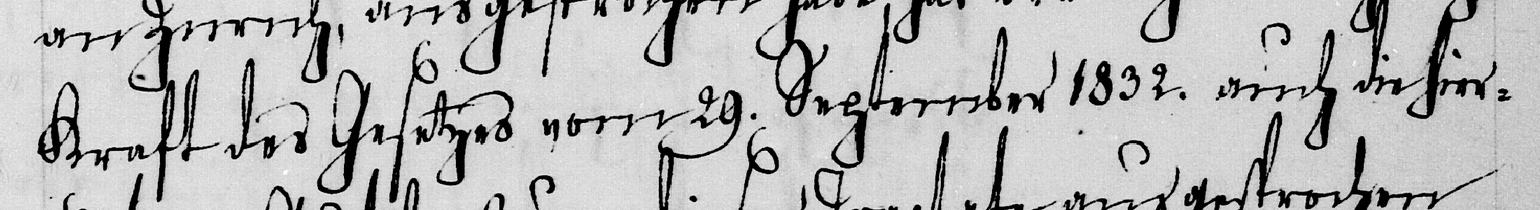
Kraft des Gesetzes vom 29. September 1832. auch die hier¬
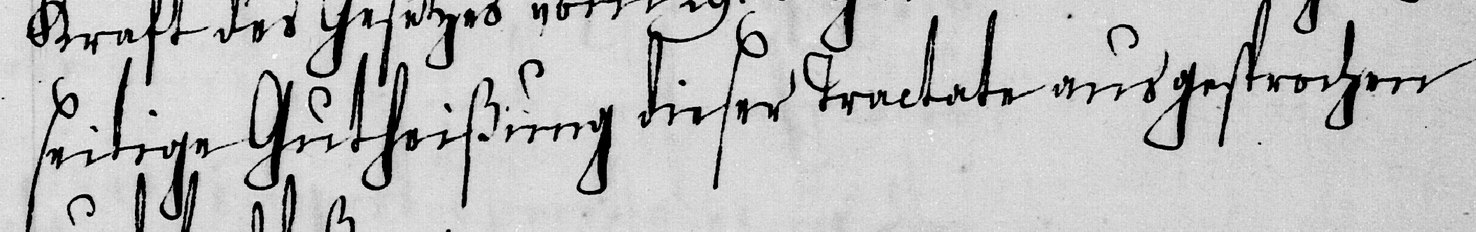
seitige Gutheißung dieser Tractate ausgesprochen
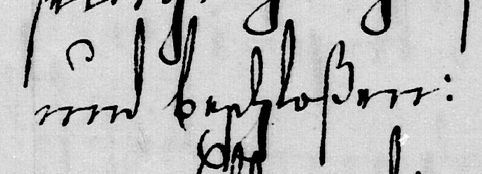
und beschloßen:
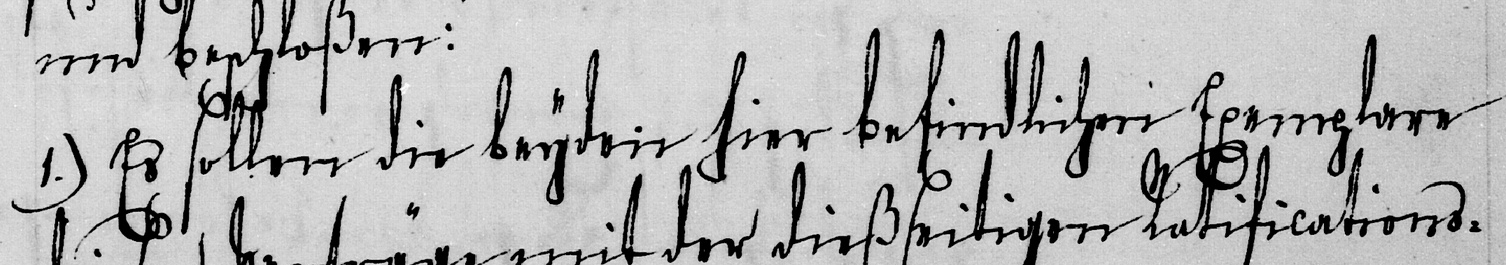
Es sollen die beyden hier befindlichen Exemplare
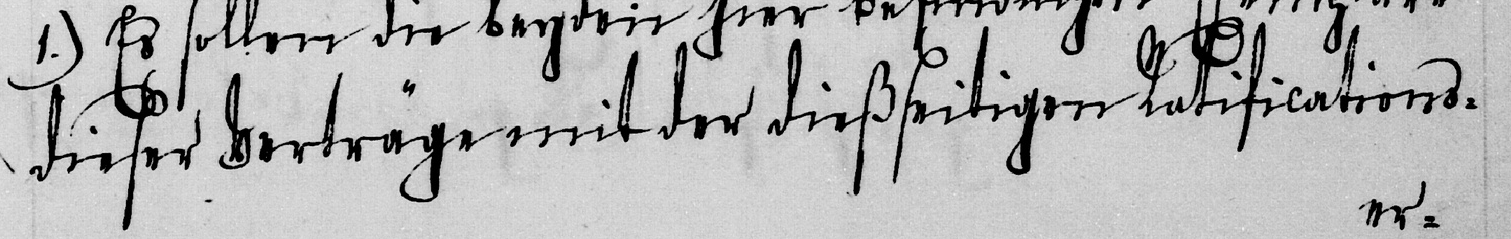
dieser Verträge mit der dießseitigen Ratifications-
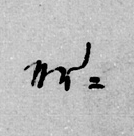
er¬
